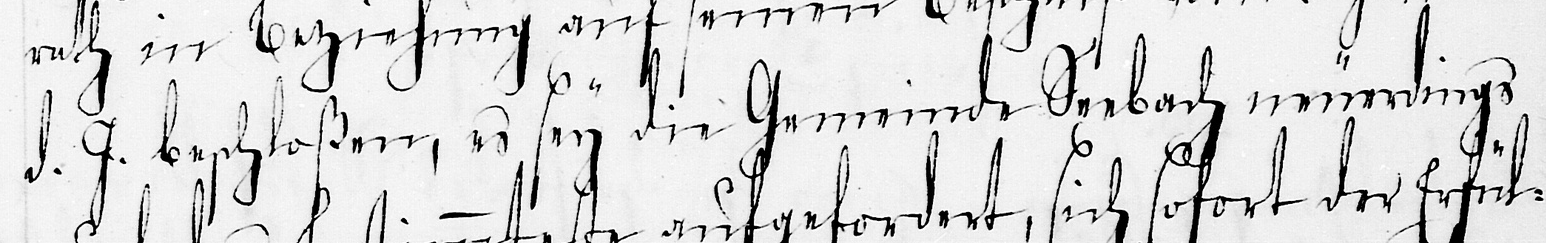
d. J. beschloßen, es sey die Gemeinde Seebach neuerdings
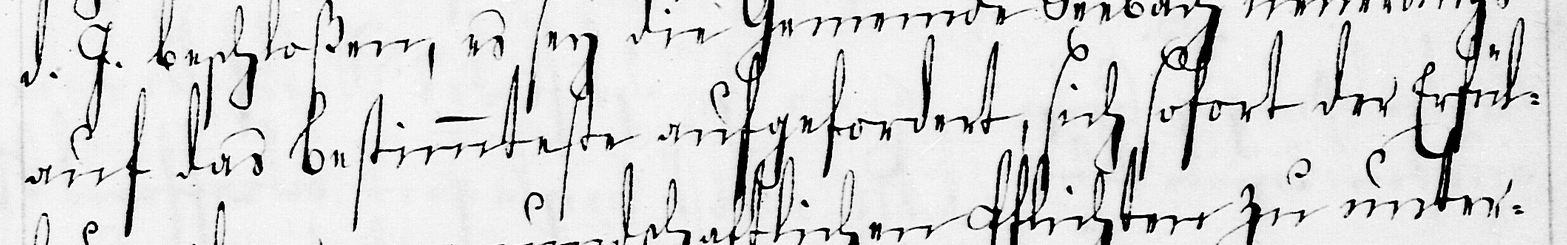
auf das Bestimmteste aufgefordert, sich sofort der Erfül¬
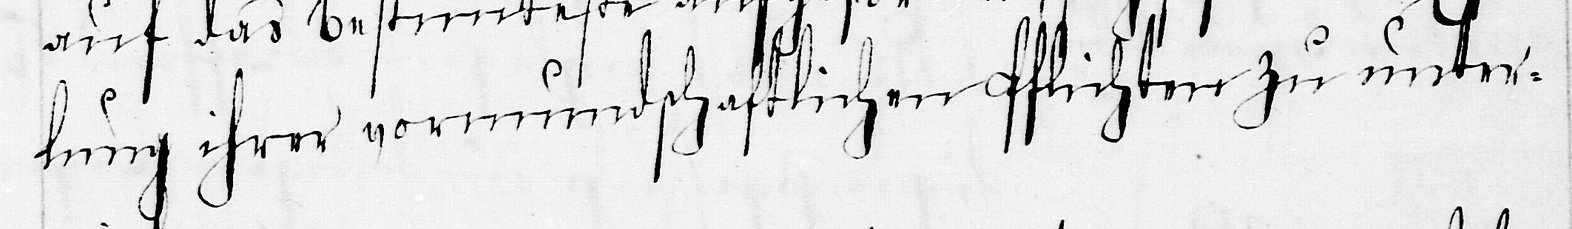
lung ihrer vormundschaftlichen Pflichten zu unter¬
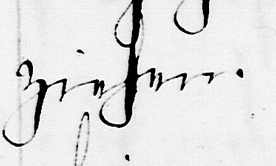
ziehen.
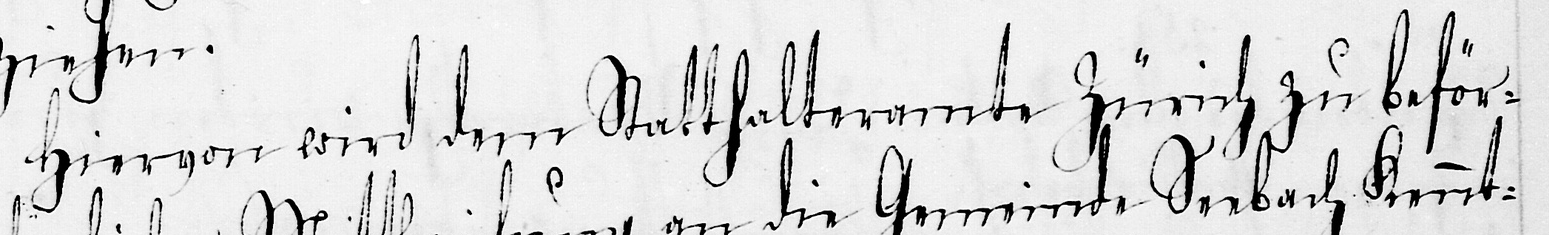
Hiervon wird dem Statthalteramte Zürich zu beför¬
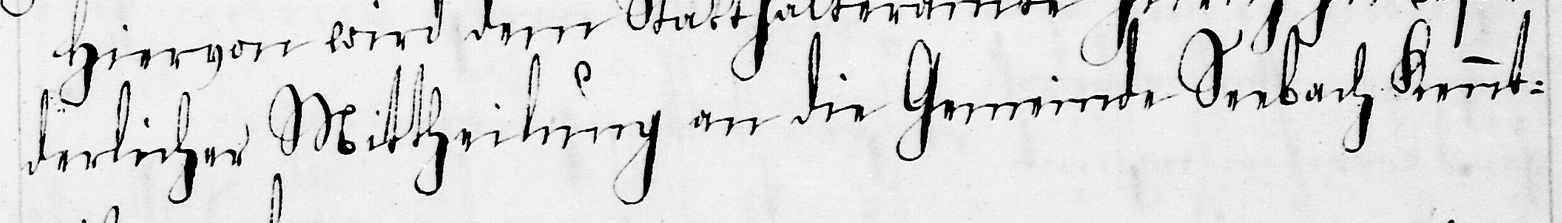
derlicher Mittheilung an die Gemeinde Seebach Kennt¬
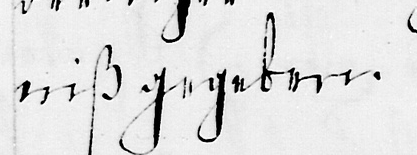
niß gegeben.
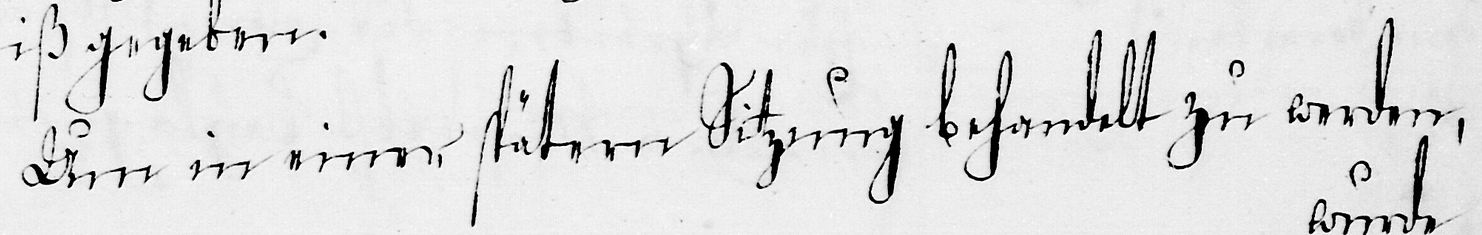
Um in einer spätern Sitzung behandelt zu werden,
